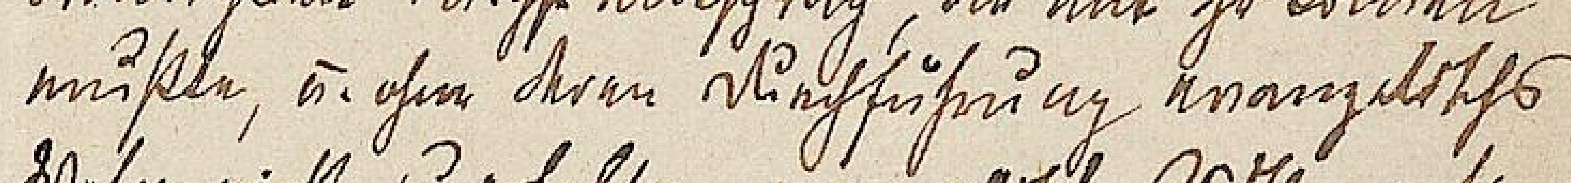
mußten, u. ohne deren Durchführung. evangelisches
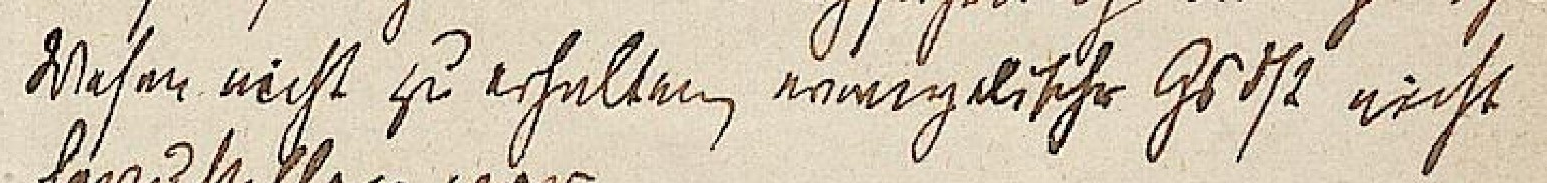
Wesen nicht zu erhalten, evangelischer Gsdst nicht
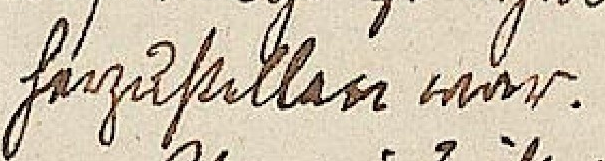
herzustellen war.
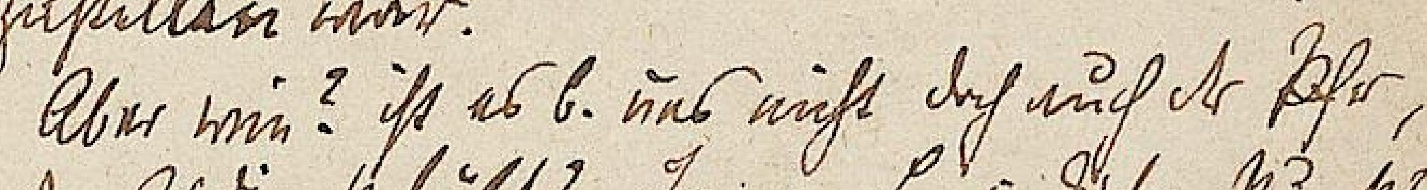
Aber wie? ist es b. uns nicht doch auch der Pfr,
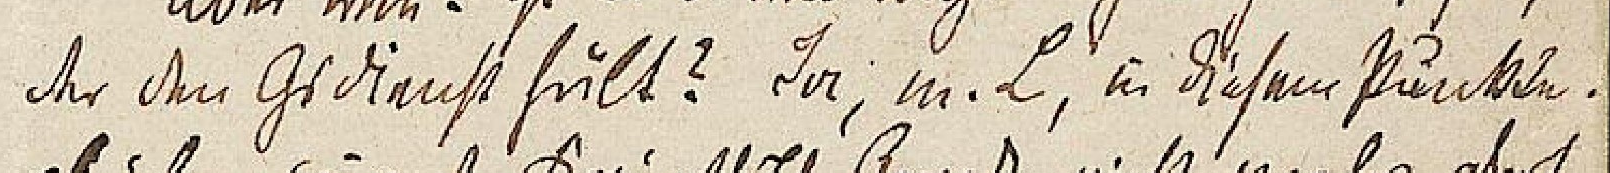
der den Gsdienst hält? Ja, m. L., in diesem Punkte.
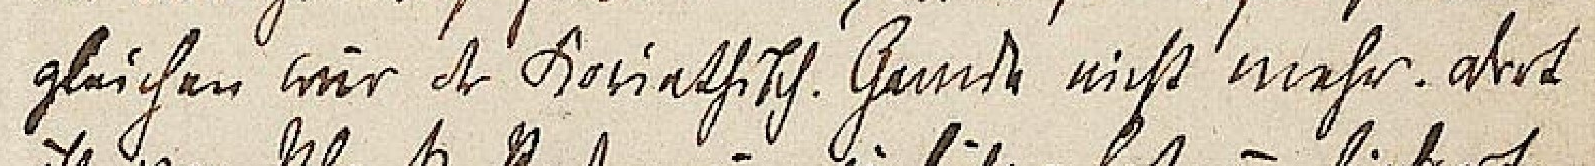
gleichen wir der Korinthisch. Gemde nicht mehr. Dort
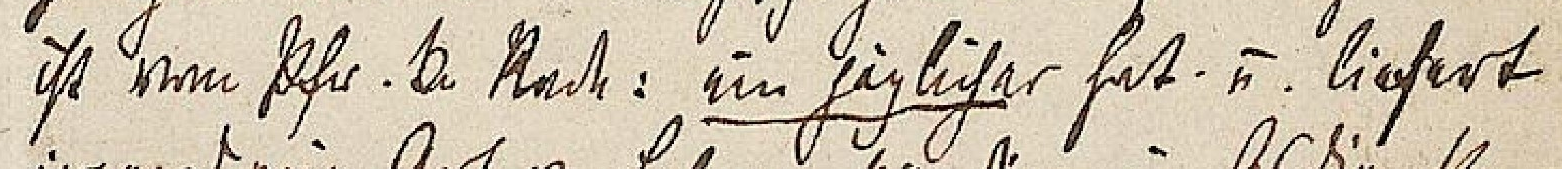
ist vom Pfr. kn. Rede: ein jeglicher hat. u. liefert
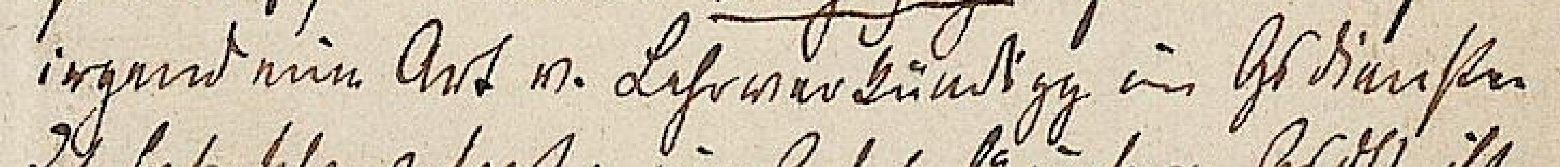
irgendeine Art v. Lehrverkündigg im Gsdienste.
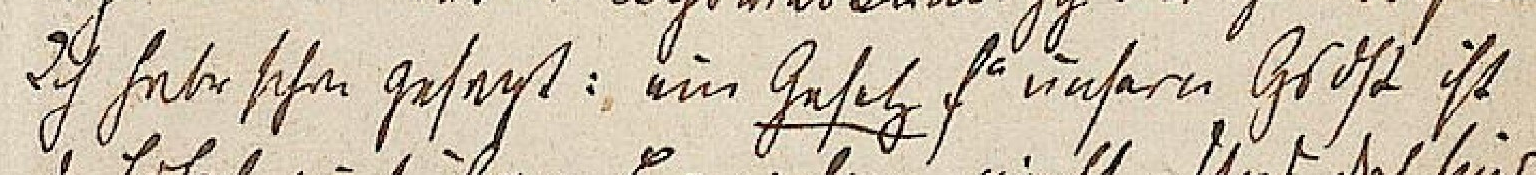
Ich habe schon gesagt: eine Gesetz fü unsern Gsdst ist
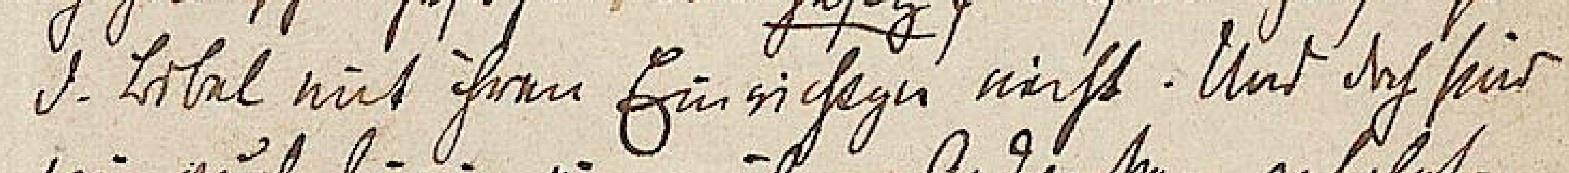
d. Bibel mit ihren Einrichtgn nicht. Und doch sind
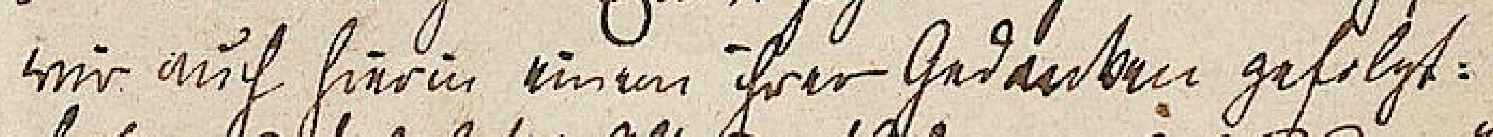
wir auch hierin einem ihrer Gedanken gefolgt:
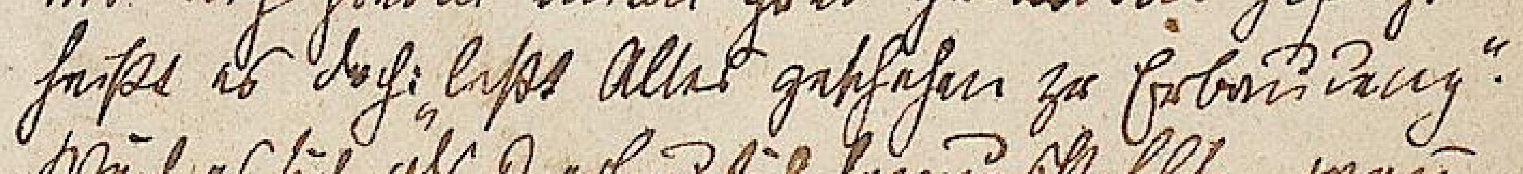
heißt es doch: "laßt Alle geschehen zu Erbauung."
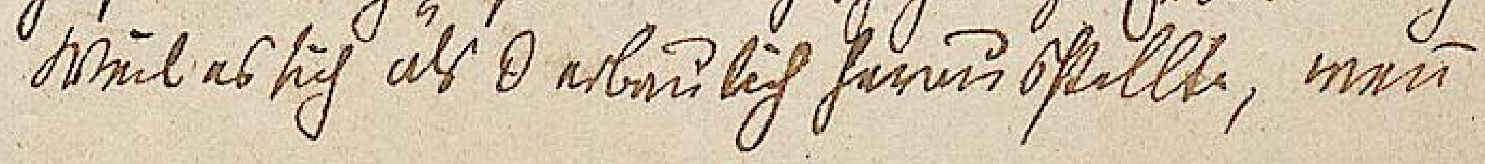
Weil es sich als o erbaulich herausstellte, wen
